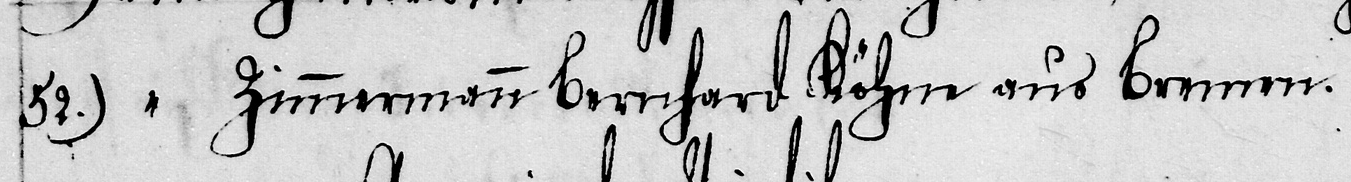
52.) “ Zimmermann Bernhard Köhne aus Bremen.
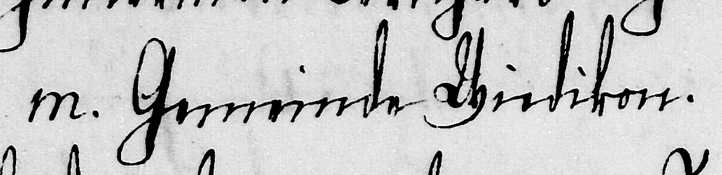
m. Gemeinde Wiedikon.
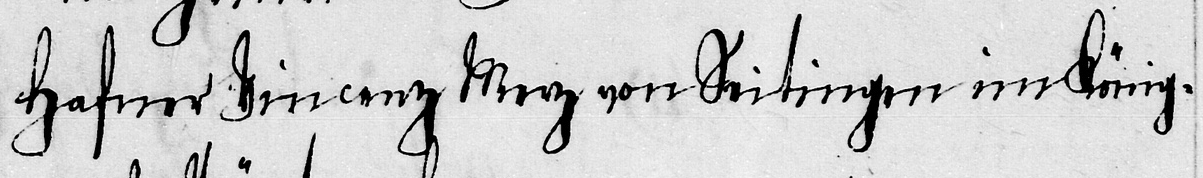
Hafner Vincenz Merz von Seitingen im König¬
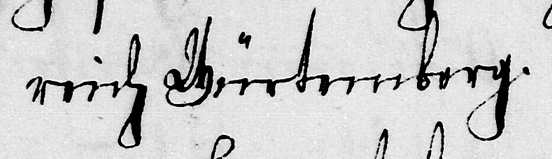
reich Würtemberg.
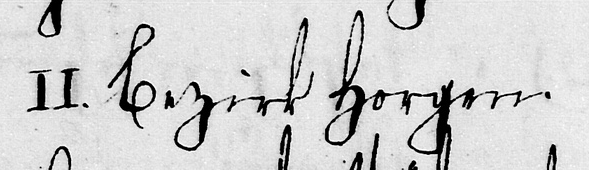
II. Bezirk Horgen.
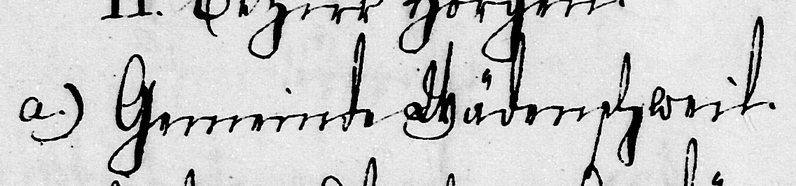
a.) Gemeinde Wädenschweil.
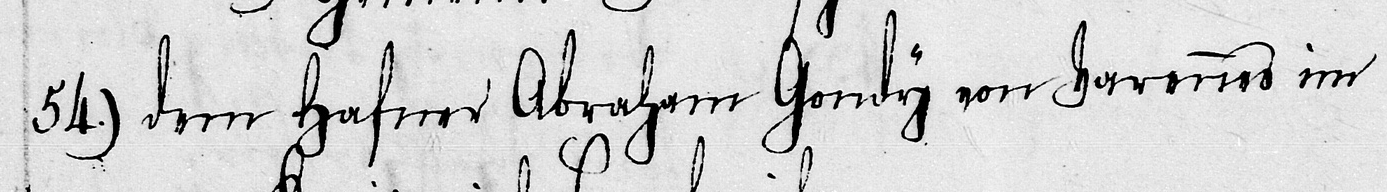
54.) dem Hafner Abraham Gondy von Varennes im
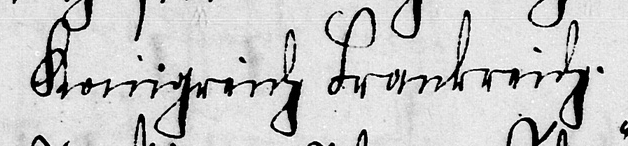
Königreich Frankreich.
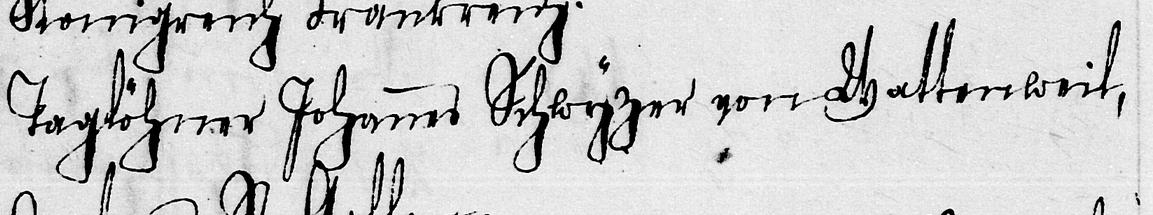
Taglöhner Johannes Schwyzer von Wattenweil,
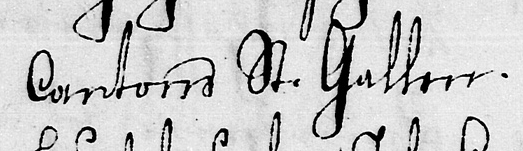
Cantons St. Gallen.
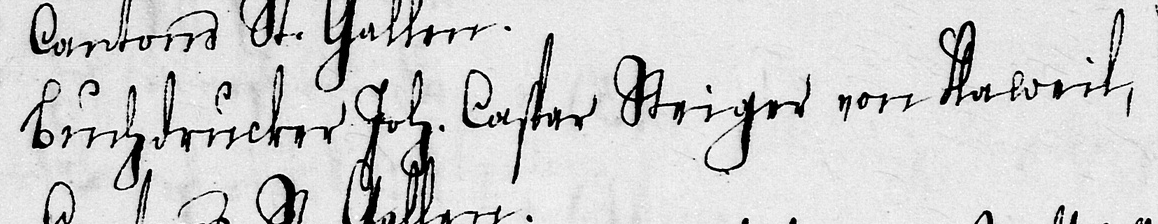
Buchdrucker Joh. Caspar Steiger von Flaweil,
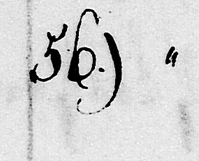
56.) “
